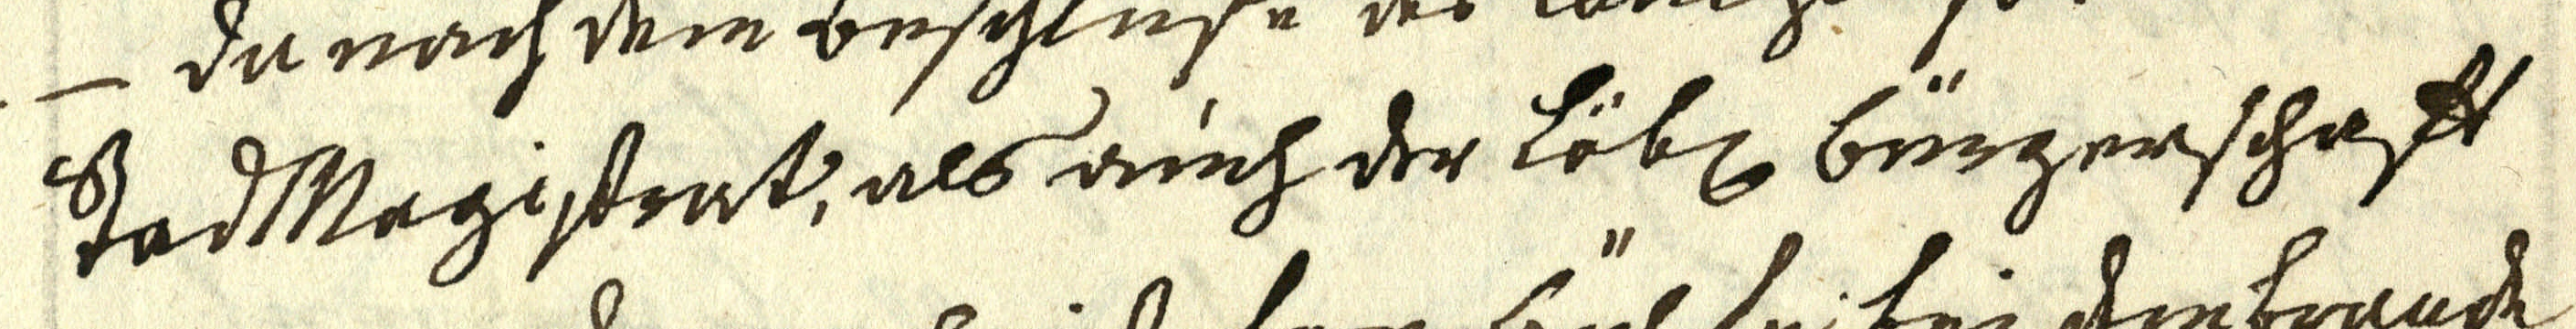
StadMagistrat, als auch der Löbl. Bürgerschaft
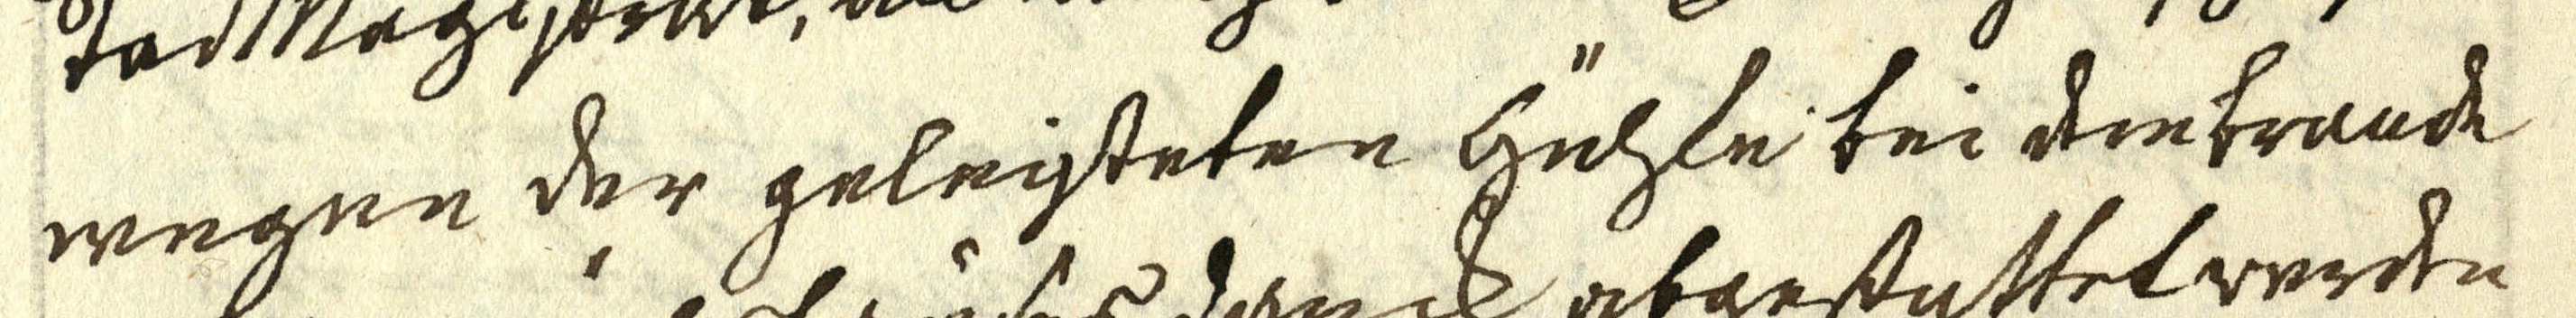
wegen der geleisteten Hülfe bei dem Brande
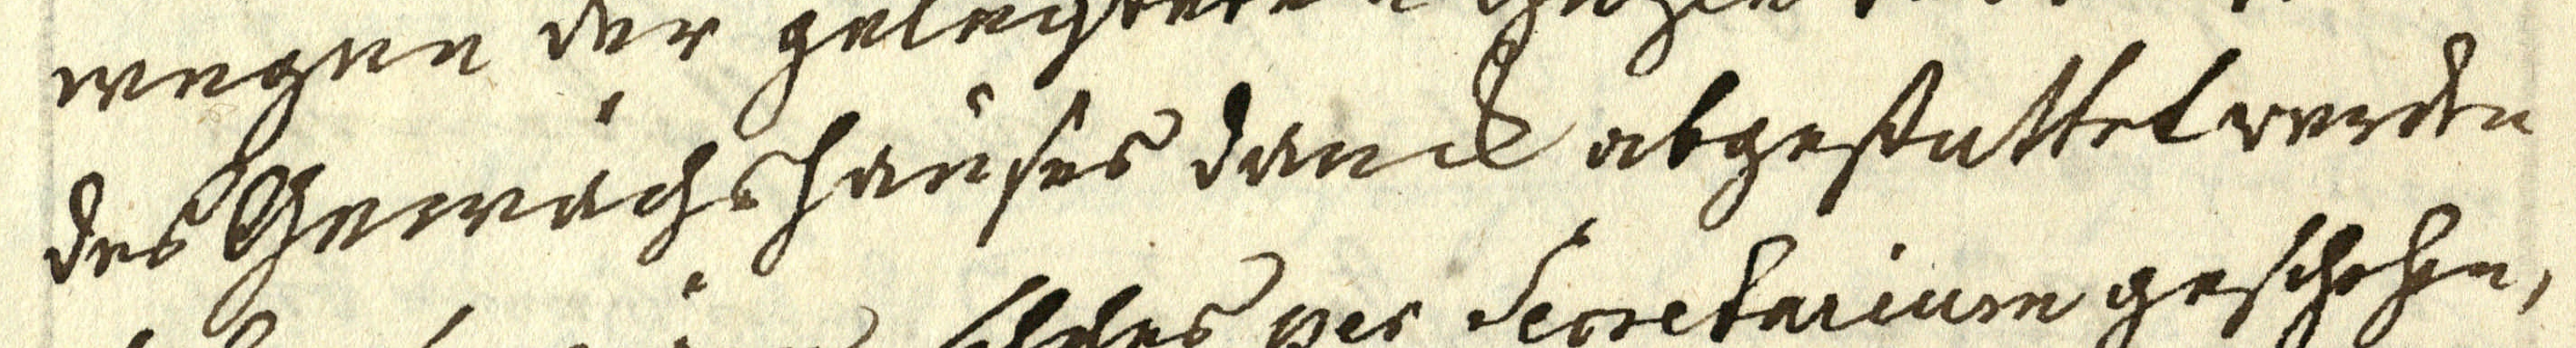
des Gewächshauses danck abgestattet werden
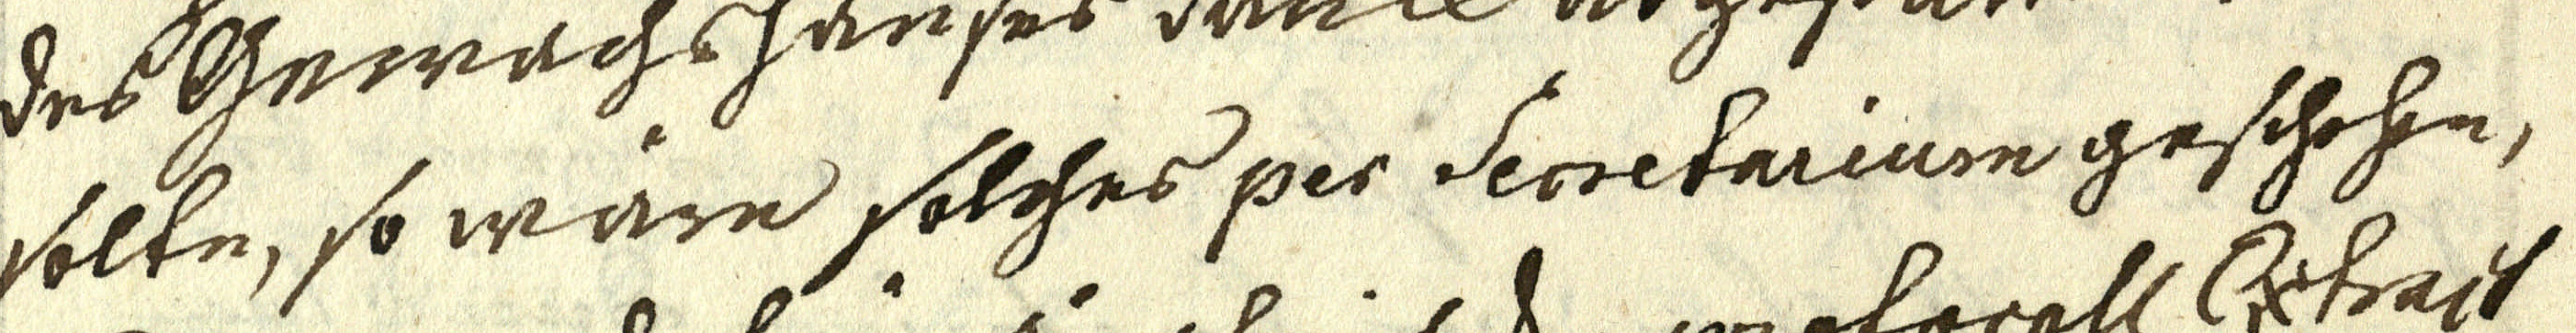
solte, so wäre solches per Secretarium geschehen,
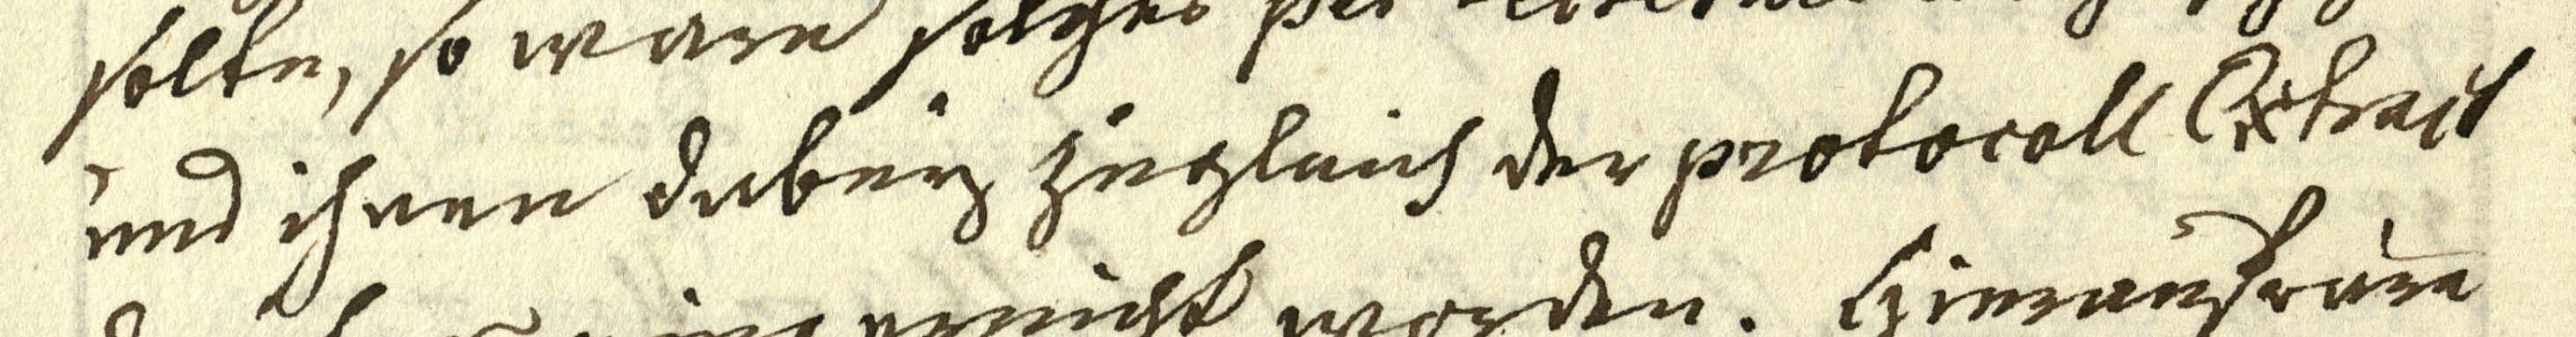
und ihnen dabeÿ zugleich der protocoll Extract
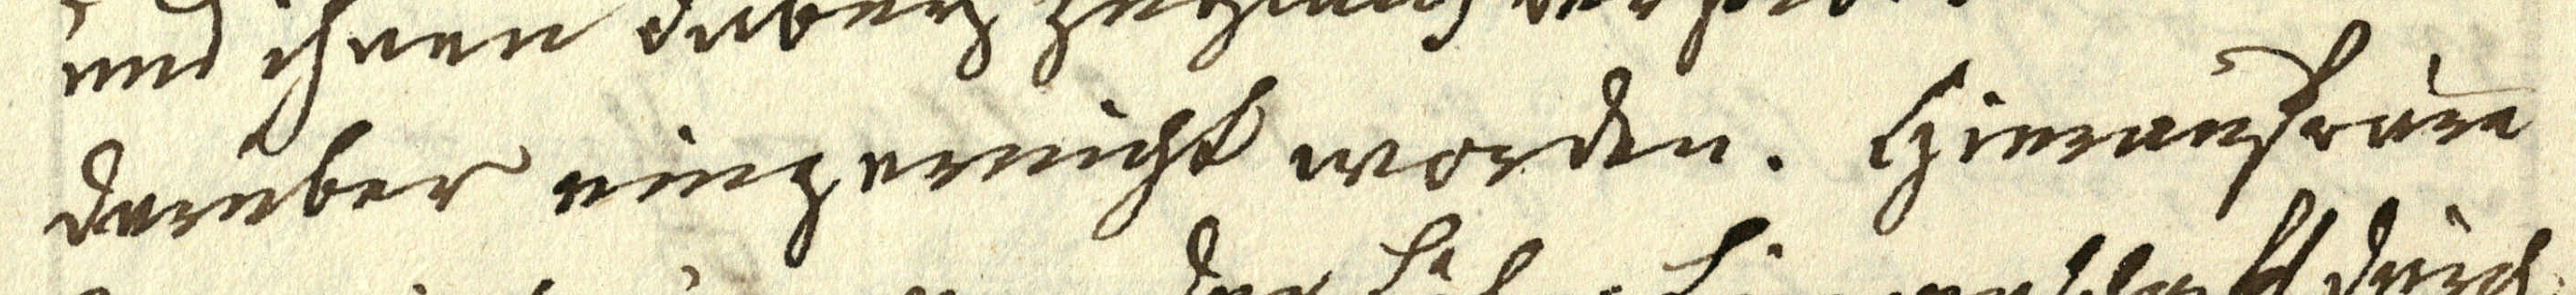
darüber eingereicht worden. Hierauf wäre
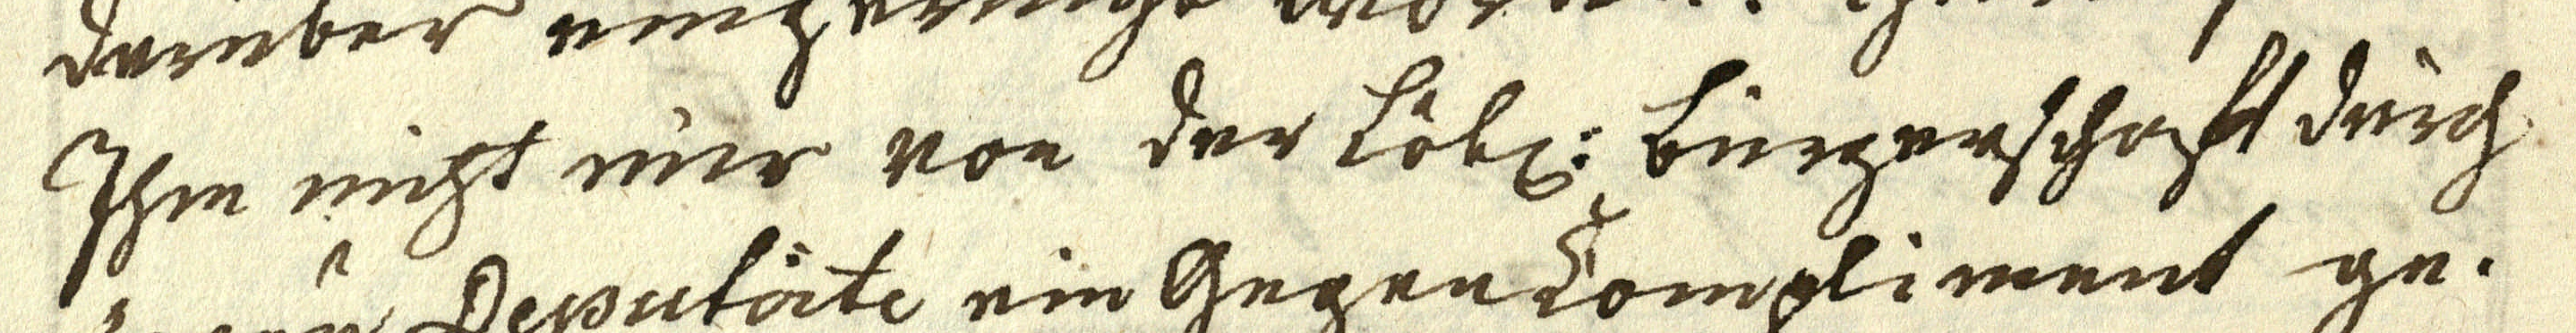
Ihm nicht nur von der Löb. Bürgerschaft durch
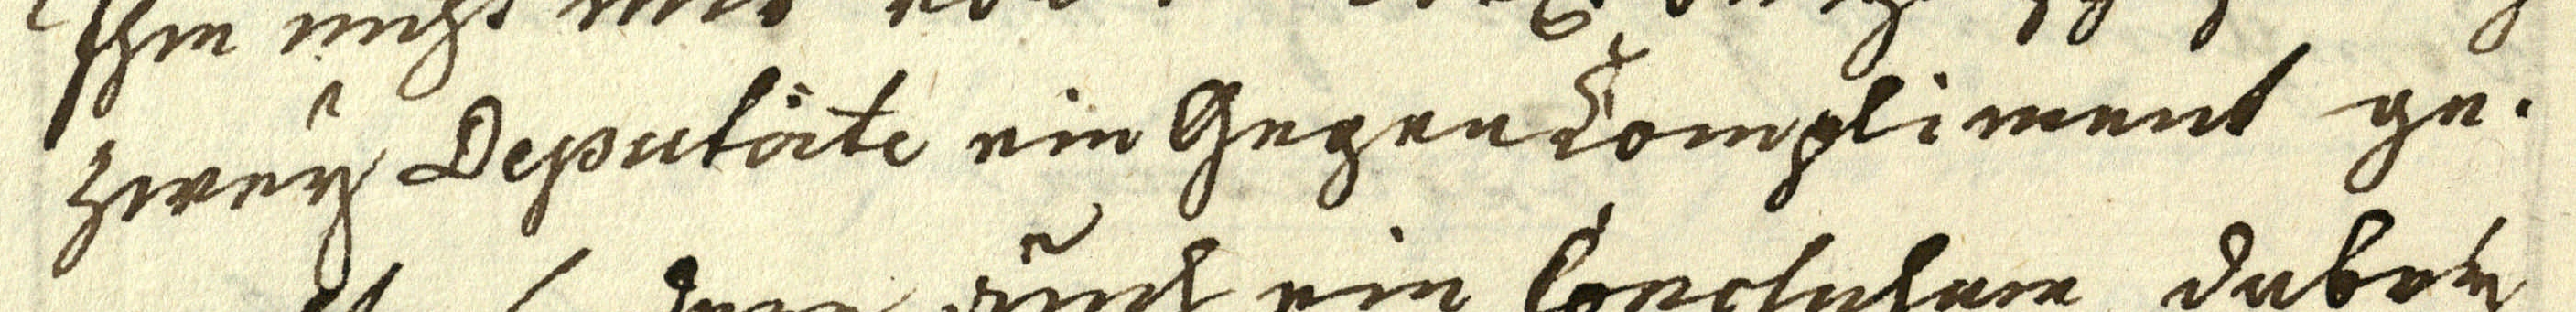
zweÿ Deputirte ein GegenCompliment ge¬
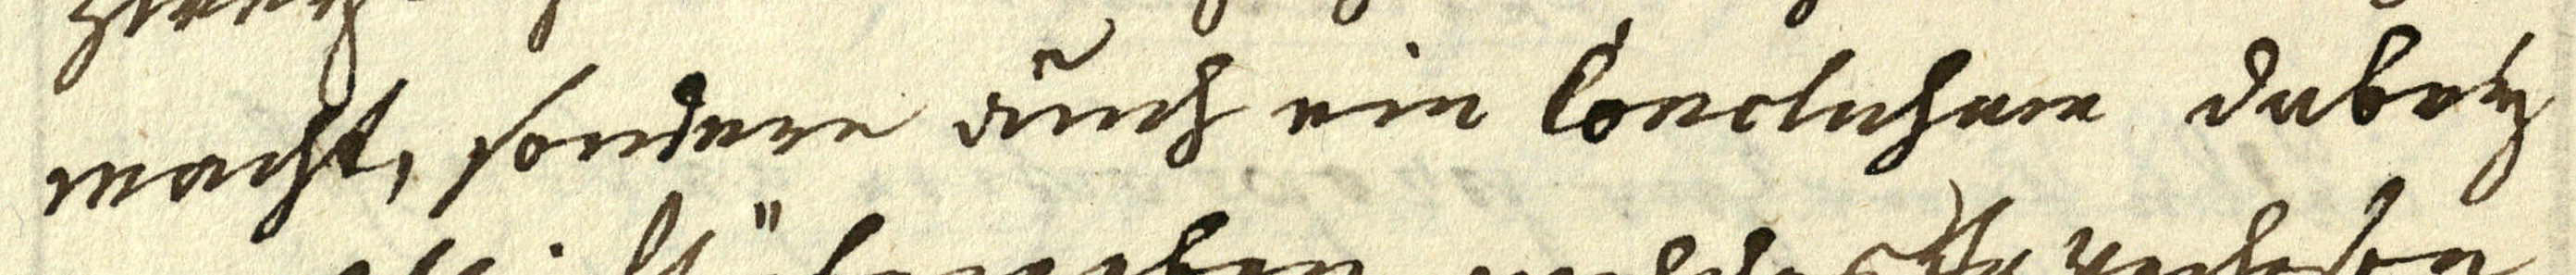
macht, sondern auch ein Conclusum dabeÿ
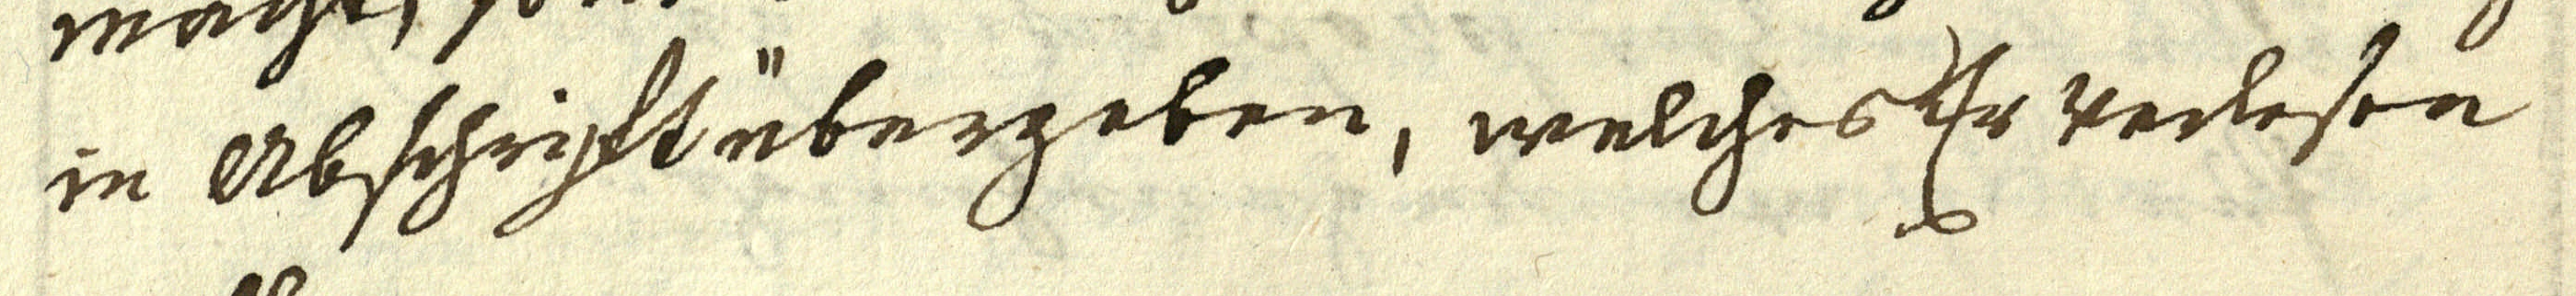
in Abschrift übergeben, welches Er verlesen
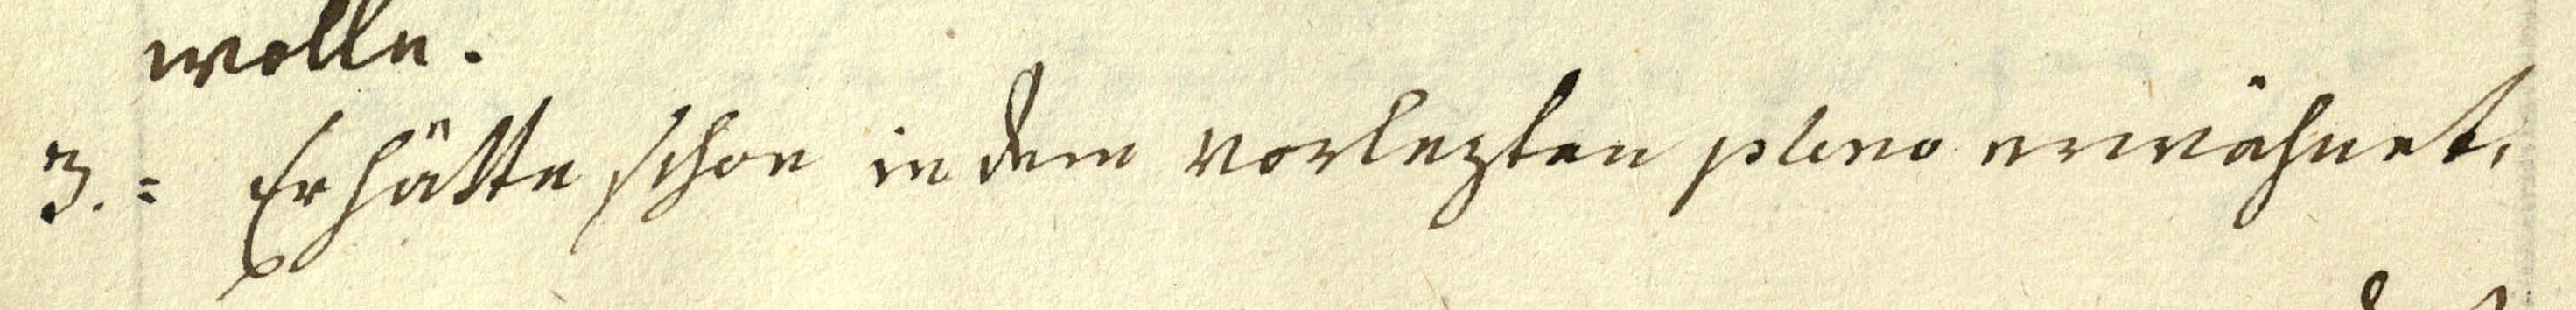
3. Er hätte schon in dem vorlezten pleno erwähnet,
